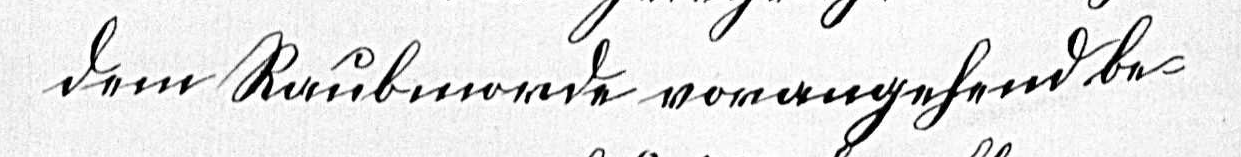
dem Raubmorde vorangehend be¬
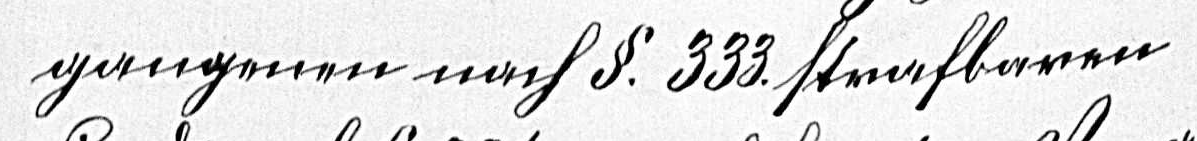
gangenen nach §. 333. strafbaren
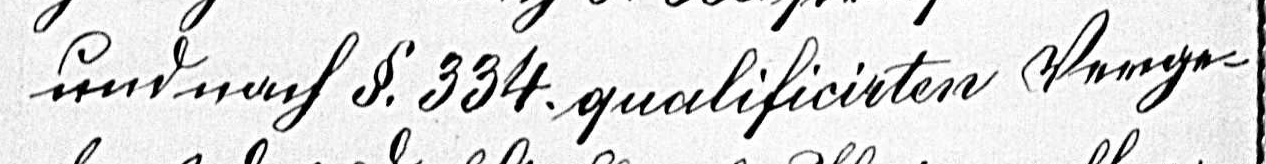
und nach §. 334. qualificirten Verge¬
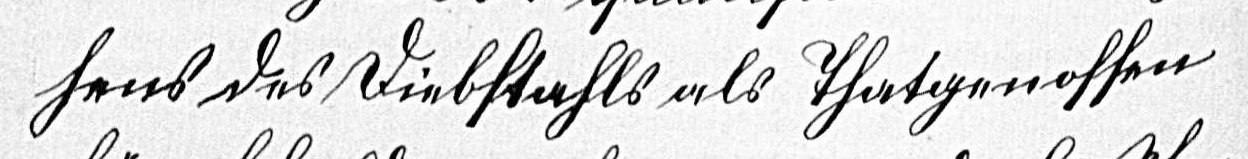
hens des Diebstahls als Thatgenossen
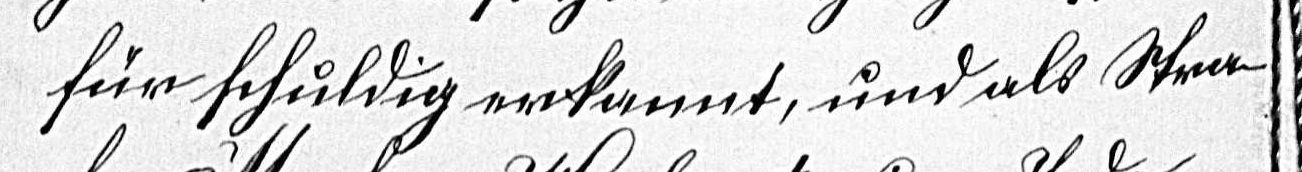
für schuldig erkannt, und als Stra¬
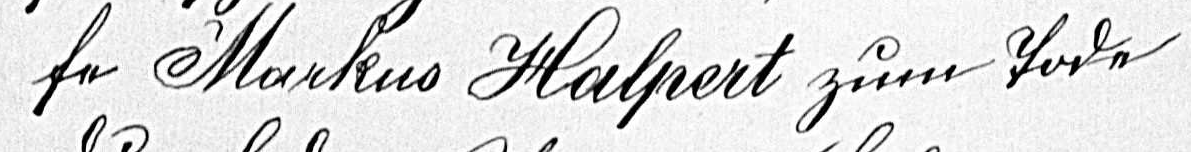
fe Markus Halpert zum Tode
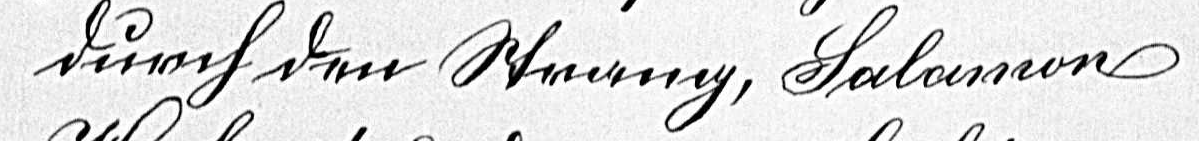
durch den Strang, Salamon
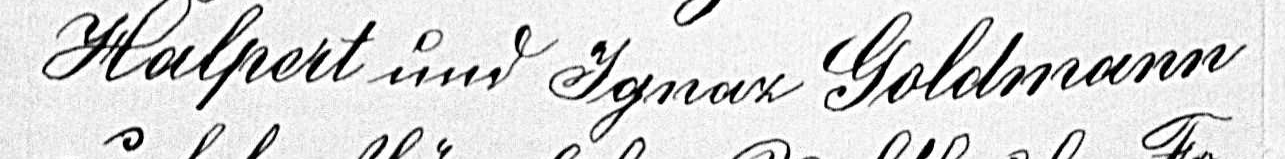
Halpert und Jgnaz Goldmann
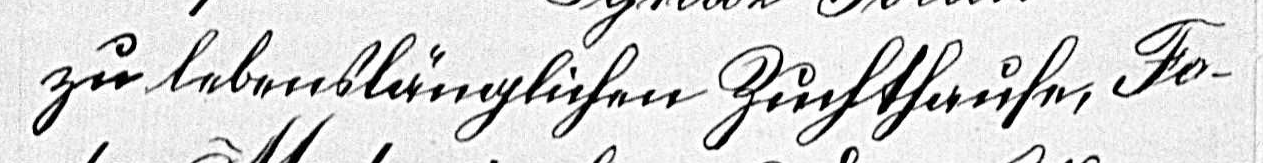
zu lebenslänglichen Zuchthause, Fo¬
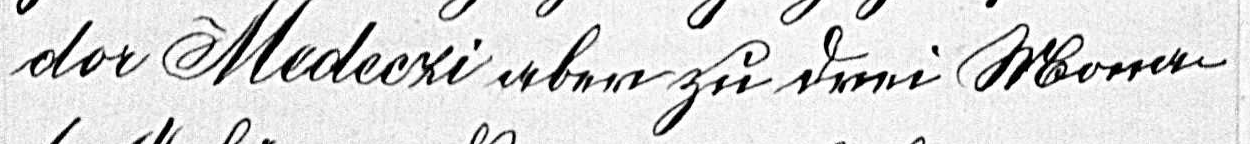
dor Medeczi aber zu drei Mona¬
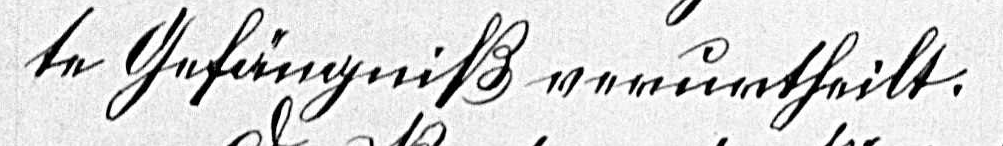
te Gefängniß verurtheilt.
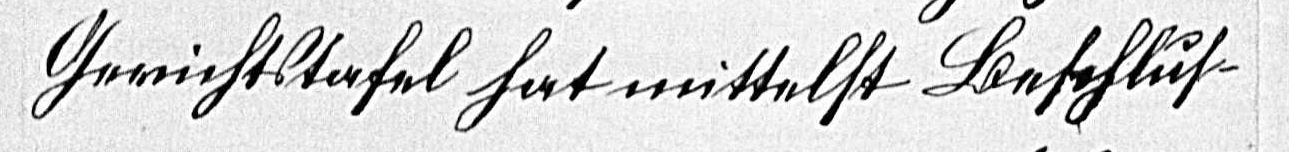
Gerichtstafel hat mittelst Beschlus¬
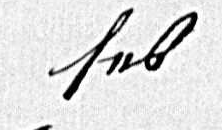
ses
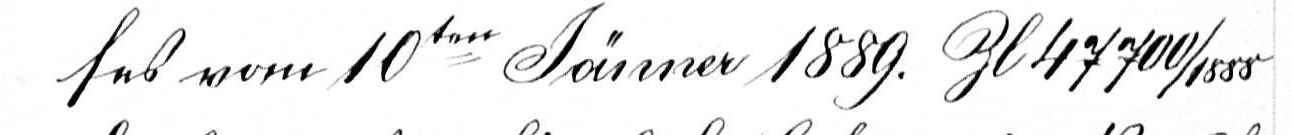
ses vom 10ten Jänner 1889. Zl 47700/1888
